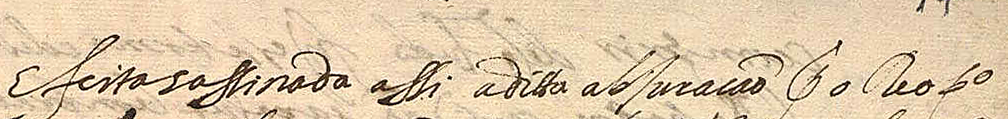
E feita E assinada assi a ditta abJuração p̄ o Reo po
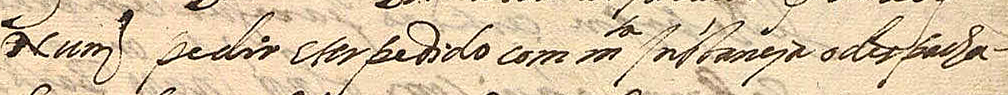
Nunz̄ pedir e ter pedido com mta Jnstancja o despacha
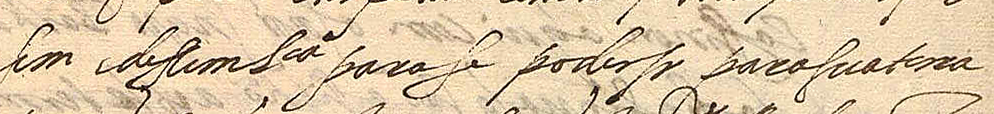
sem e dessem lça para se poder Jr para sua terra
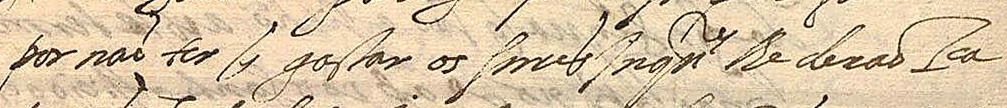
por não ter q̄ gastar os snres̄ Jnqures lhe deraõ Lça
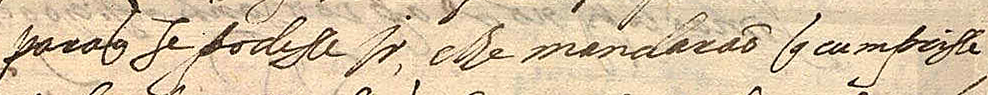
para q̄ se podesse Jr, e lhe mandaraõ q̄ cumprisse
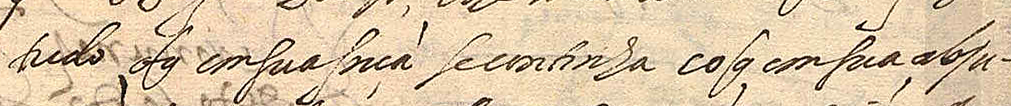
tudo o q̄ em sua snçā se continha e o q̄ em sua abju
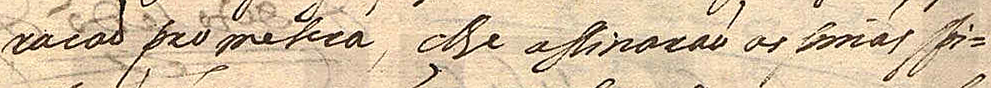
raçaõ prometera, e lhe assinaraõ as pniās spi
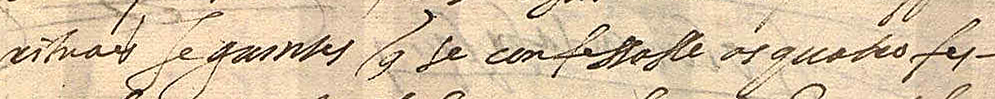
rituaes seguintes q̄ se confessasse as quatro fes
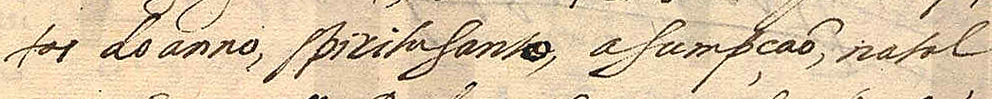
tas do anno, spiritu santo, asumpçaõ, natal
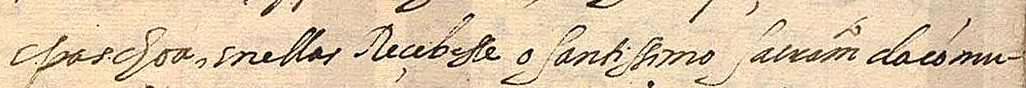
e paschoa, e nellas Recebesse o Santissimo Sacramto da cōmu
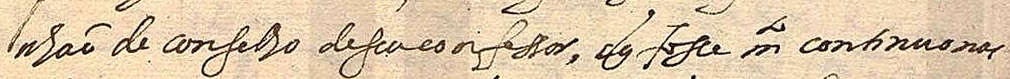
nhaõ de conselho de seu confessor, e q̄ fosse mto continuo nas
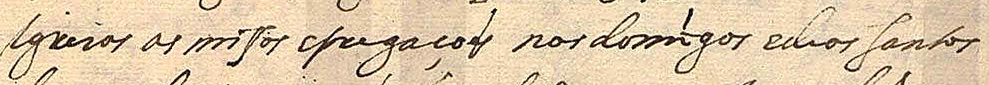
Jgreias as missas e pregaçoẽs nos domīgos e dias santos
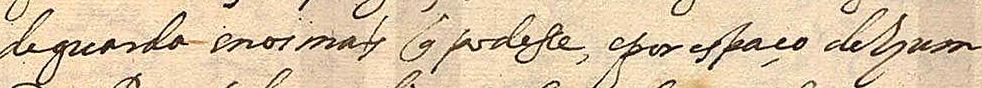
de guarda en os mais q̄ podesse, e por espaço de hum
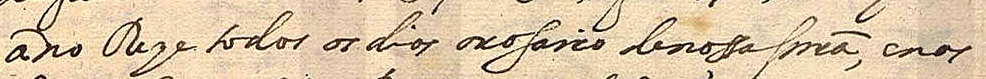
āno Reze todos os dias o rosario de nossa snrā, e nas
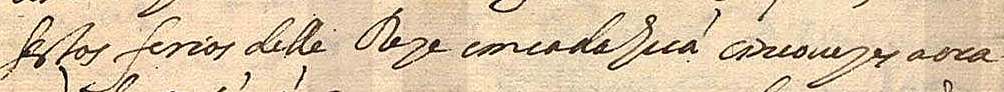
sestas feiras delle Reze em cada huā cinco uezes a ora
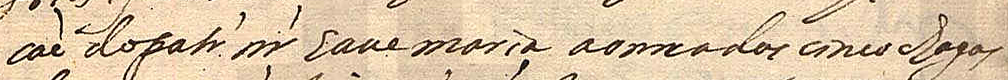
çaõ do patr̄ nr̄ E aue maria a onra das cinco chagas
